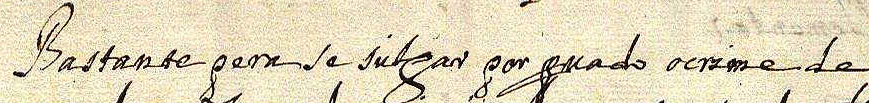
Bastante pera se iulgar por ꝓuado o crime de
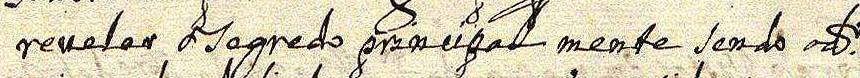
reuelar o segredo principaLmente sendo o d̄.o
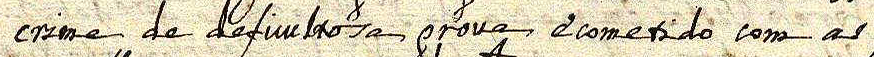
crime de deficultosa proua e cometido com as
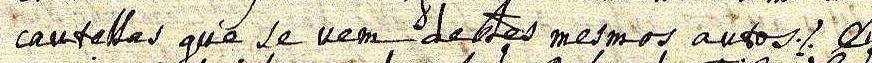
cautellas que se uem destes mesmos autos./. e
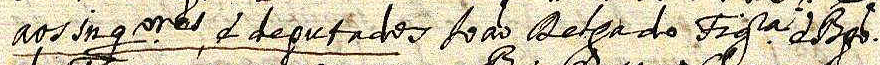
aos inꝗ.ores, e deputados Ioão Delgado Fig.ra e Bpō
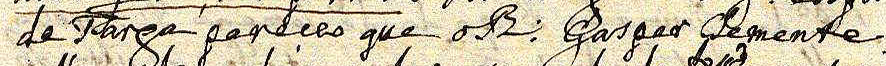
de Targa pareceo que o R: Gaspar Clemente
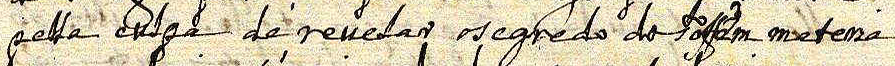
pella culpa de reuelar o segredo do sto offo em materia
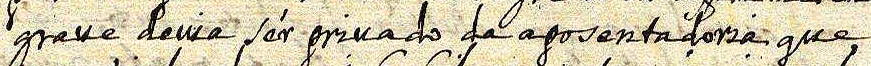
graue deuia ser priuado de aposentadoria que
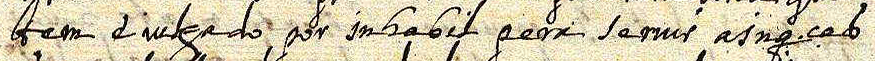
tem e iulgado por inhabil pera seruir a inꝗ.çaõ
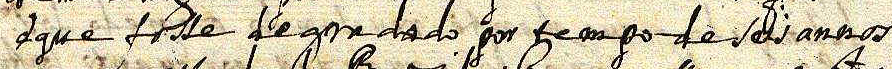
e que fosse degradado por tempo de seis annos
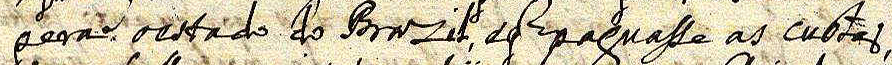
pera o estado do Brazil, e q̄ paguasse as custas,
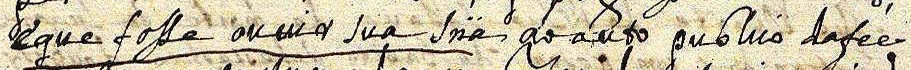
e que fosse ouuir sua snā ao auto publico da fee
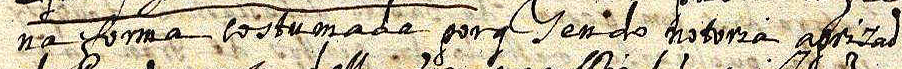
na forma costumada porq̄ sendo notoria a prizaõ
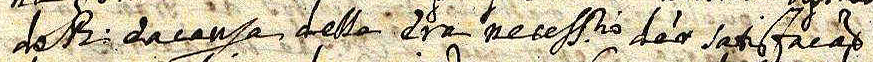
do R: e a causa della era necess.rio dar satisfaçaõ
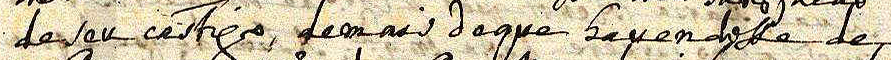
de seu castigo, de mais de que hauendosse de
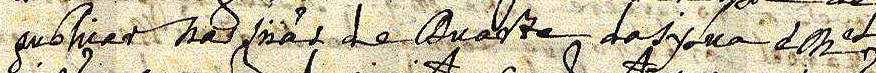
publicar nas snās de Duarte da sylua e Mel
